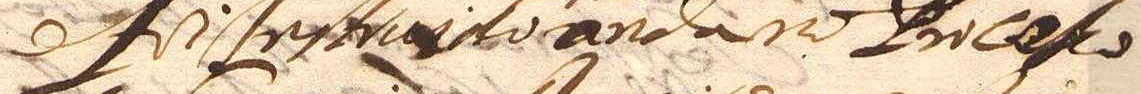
e foi Jnstruido anda no Processo
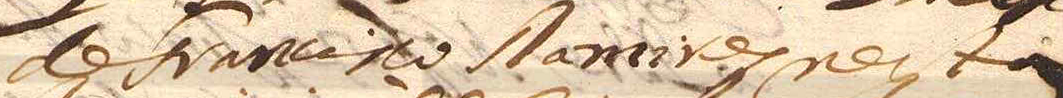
de Francisco Ramires nesta
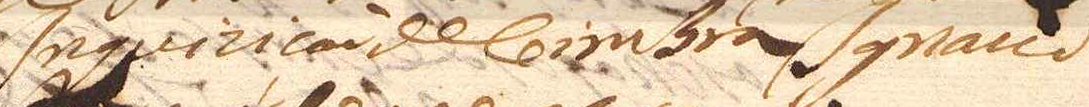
Jnquiziçaõ de Coimbra Jgnacio
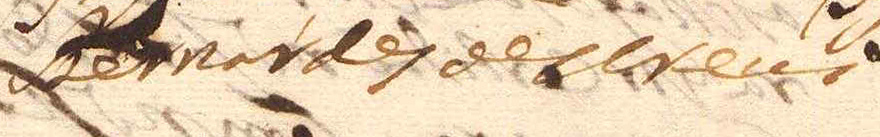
Bernardes o escreui
